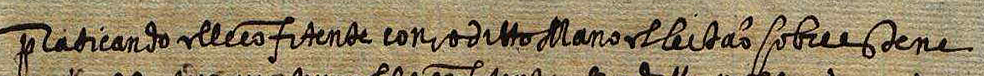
praticando elle cōfitente com o ditto Manoel leitaõ sobre este ne
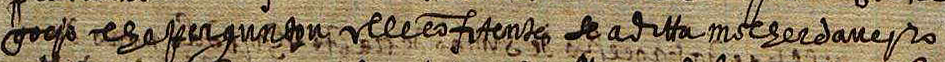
gocjo lhe perguntou elle cōfitente se a ditta molher dauejro
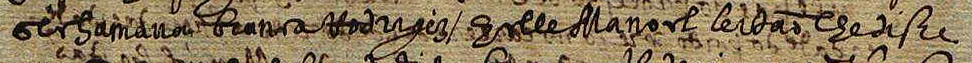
se chamaua branca Rodrigez / E elle Manoel leitão lhe disse
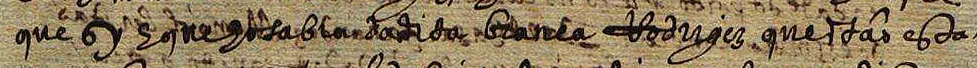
que sy E que ho sabia da dita branca Rodrigez que ētão esta
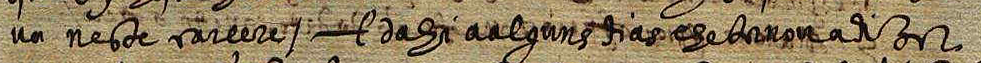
ua neste carcere / E dahi a alguns dias lhe tornou a dizer
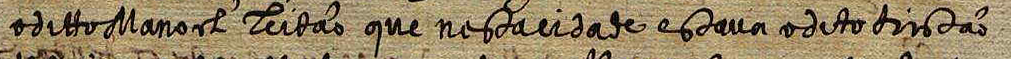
o ditto Manoel Leitão que nesta cidade estaua o dito tristaõ
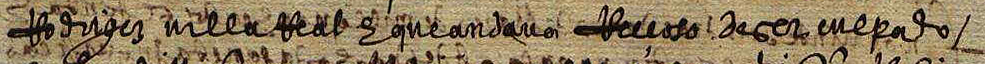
Rodrigez uilla Real E que andaua Receoso de ser culpado /
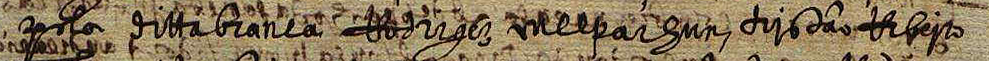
pela ditta branca Rodrigez cullpar hum tristão Ribejro
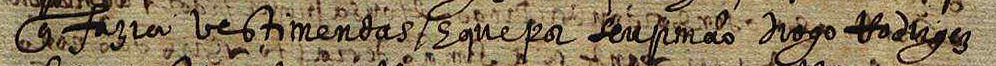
q̄ fazia vestimentas / E que por seu jrmaõ diogo Rodrigez
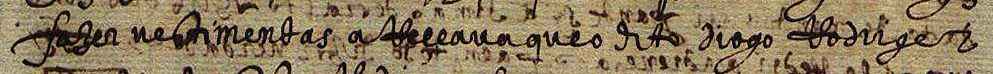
fazer uestimentas aReceaua que o dito diogo Rodrigez
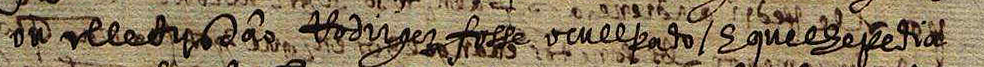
ou elle tristão Rodrigez fosse o cullpado / E que lhe pedia
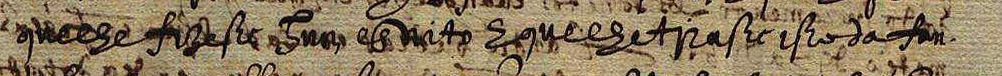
que lhe fizesse hum escrito E que lhe tjrasse isso da fan
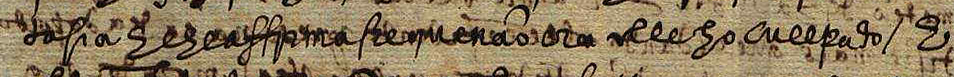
tasia E lhe affirmasse que não era elle ho cullpado / E
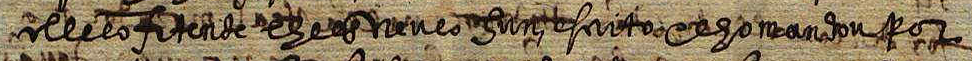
elle cōfitente lhe escreueo hum escrito e lho mandou por
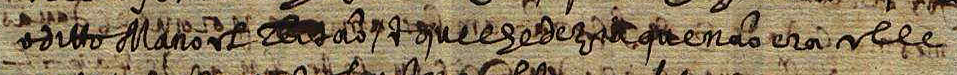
o ditto Manoel Leitaõ / ē que lhe dezia que não era elle
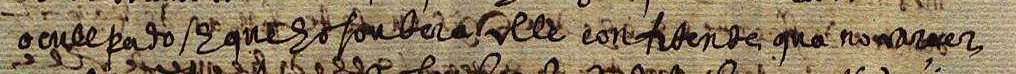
o cullpado / E que ho soubera elle confitente que no carcer
